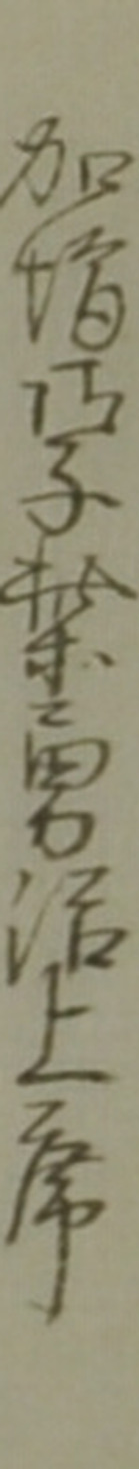加増御子柴勇治上席
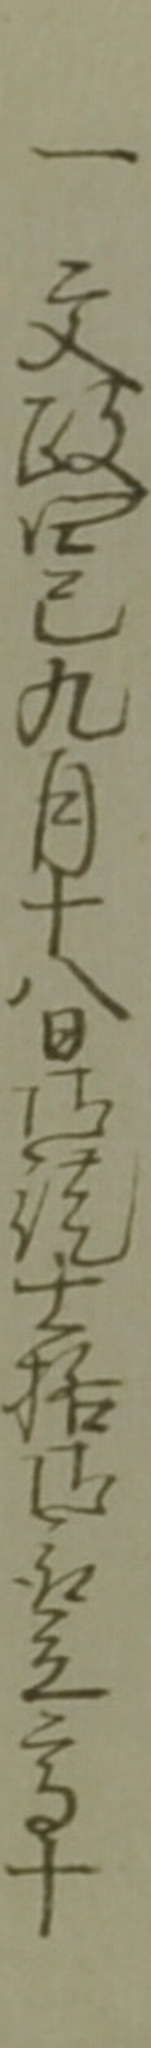一文政四巳九月十八日御徒士格御取立高十
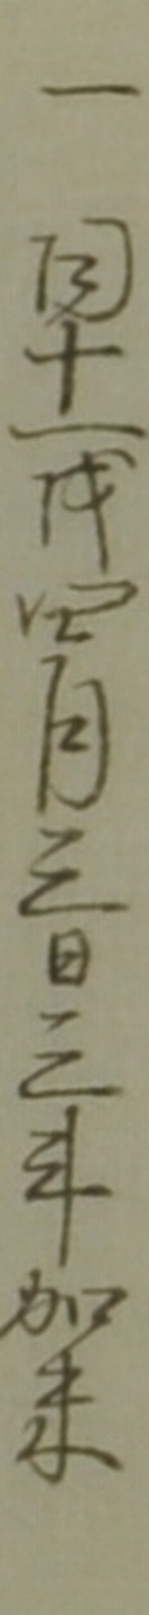一同十一戌四月三日三斗加米
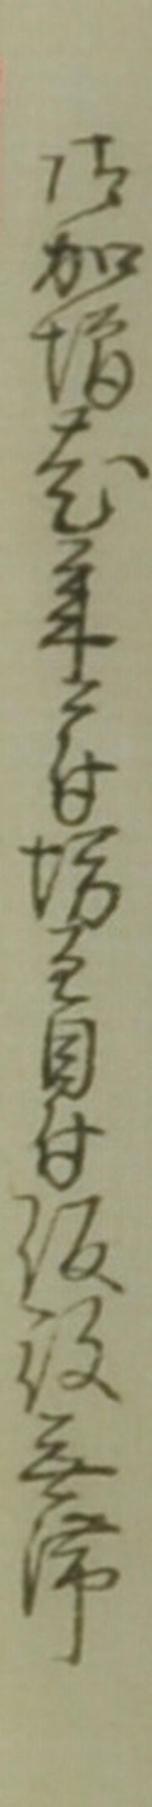御加増老年ニ付坊主目付仮役無滞

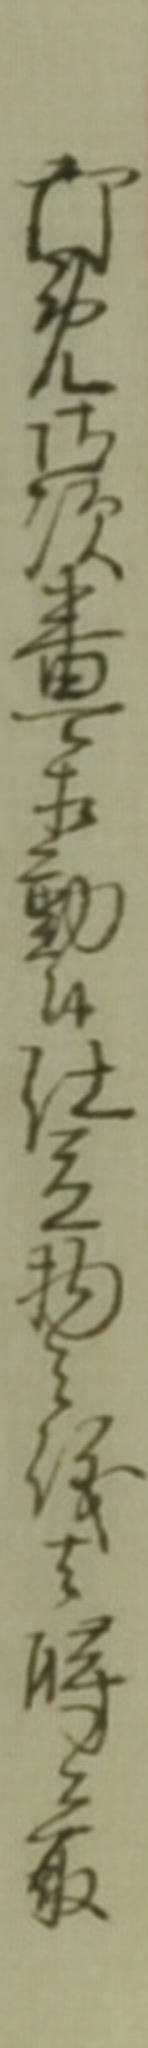御免御次番可相勤候仕立物之儀は時ニ取
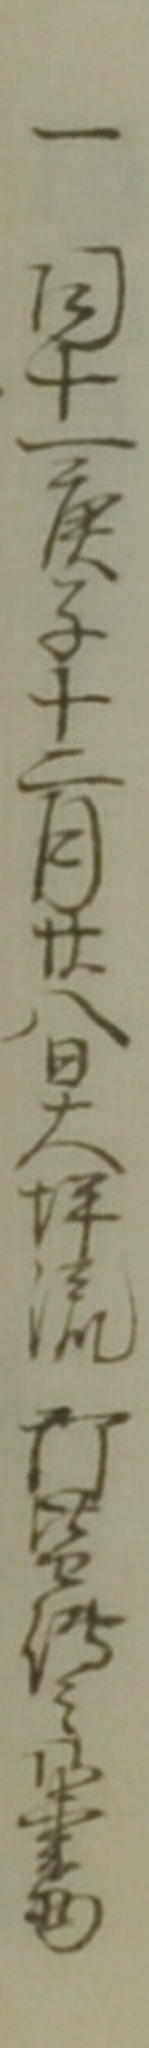一同十一庚子十二月廿八日大坪流御皆伝之御書物
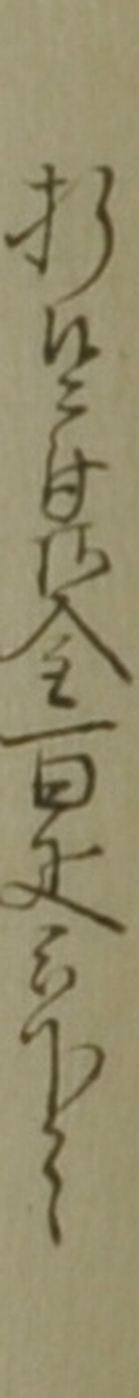折候ニ付御金百疋被下之
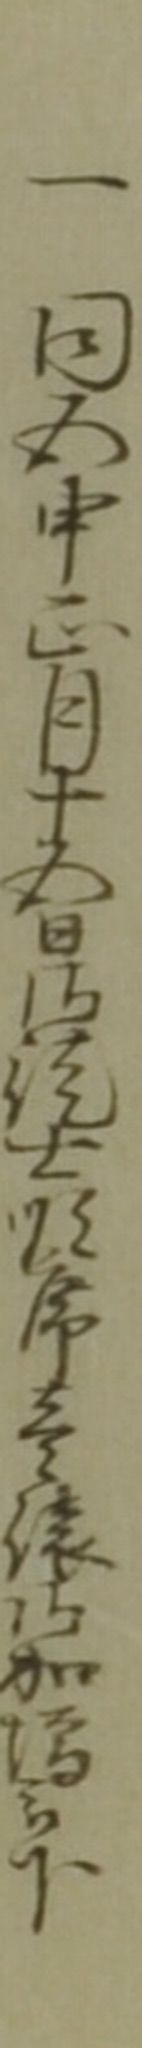一同五申正月十五日御徒士順席壱俵御加増被下
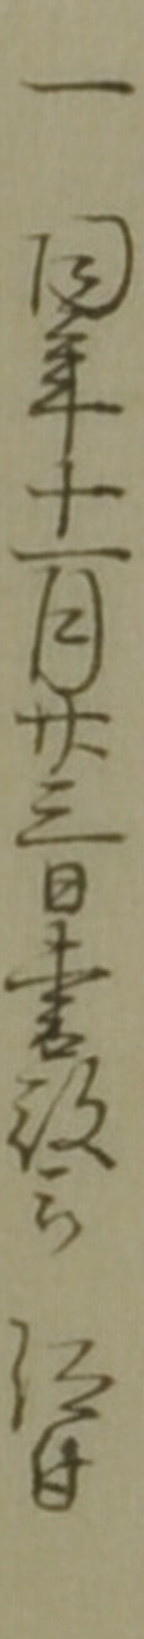一同年十一月廿三日書役被仰付
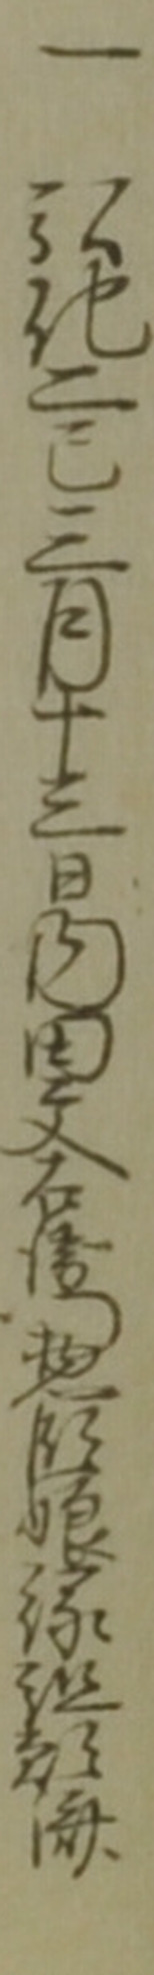一弘化二巳三月十三日内田文右衛門惣領娘縁組願済
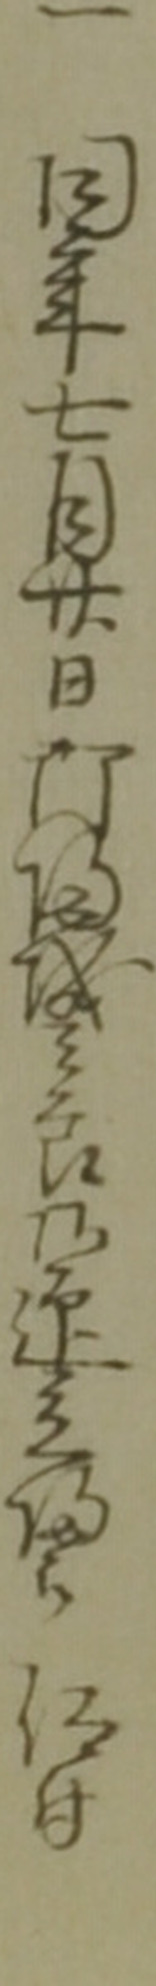一同年七月廿日御帰城之節御迎立帰被仰付

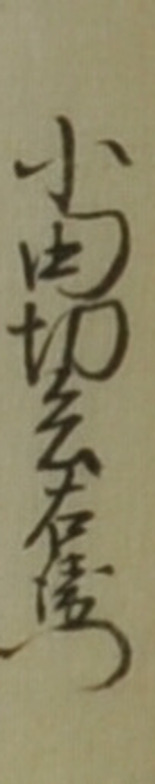小田切玄右衛門

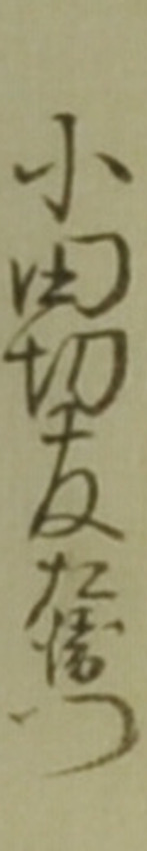小田切友左衛門
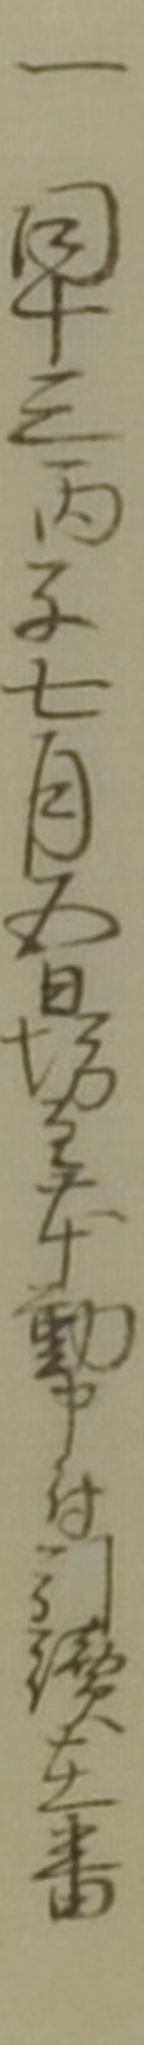一同十三丙子七月五日坊主本勤申付引続在番
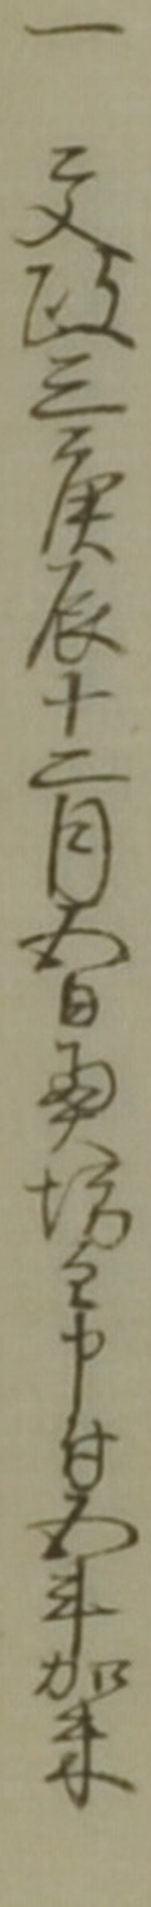一文政三庚辰十二月五日奥坊主申付五斗加米
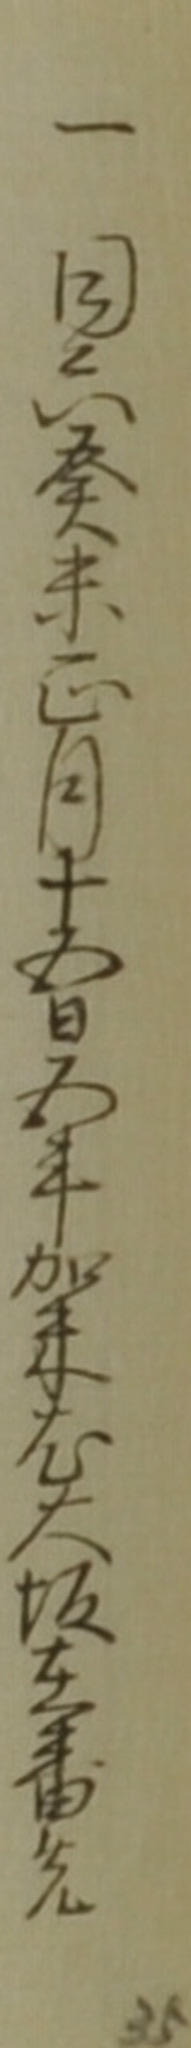一同六癸未正月十五日五斗加米尤大坂在番
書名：無足諸士勤仕録（七）
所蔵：伊那市立高遠町図書館・合同会社AMANE
